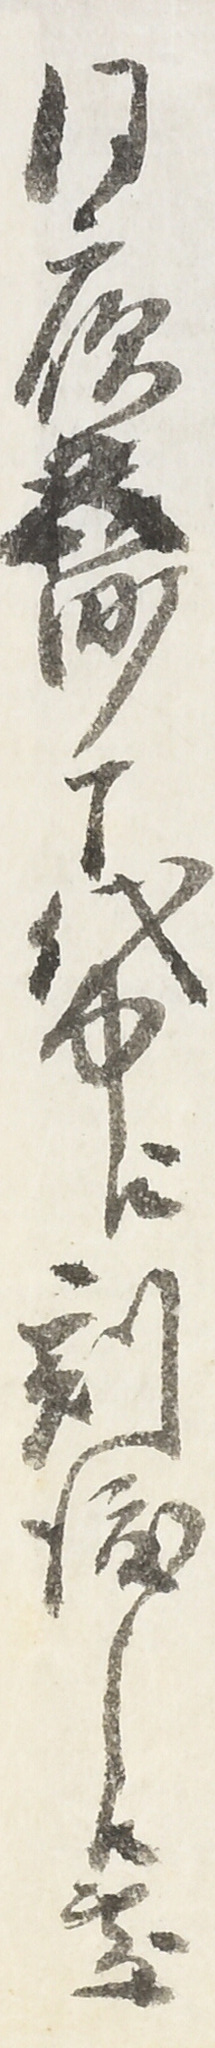同夜五町丁代中江割渡し候処
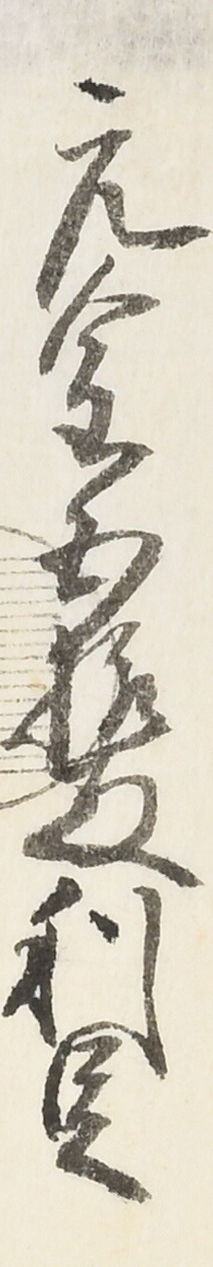元金五拾両利足
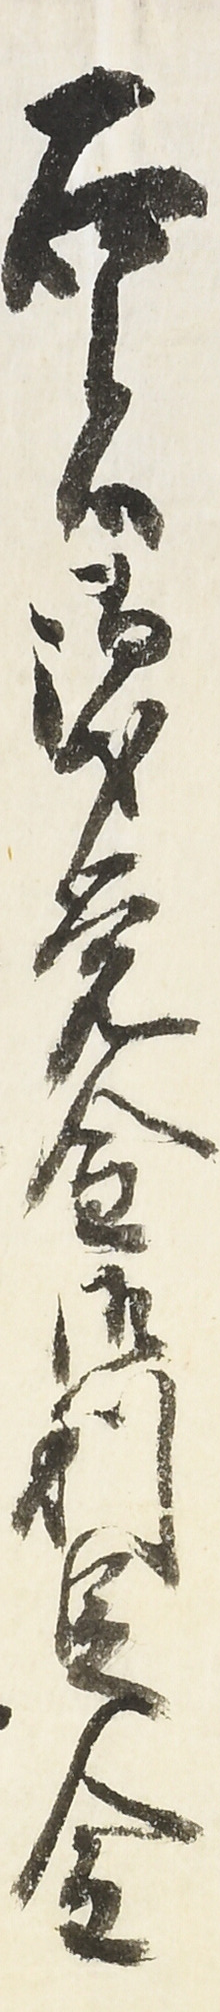右之者御身覚金御利足金
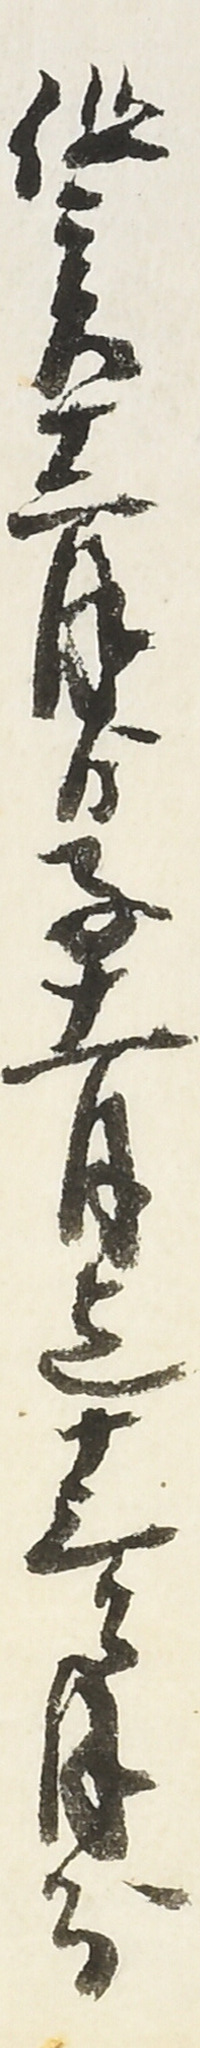但亥十二月ゟ子十一月迄十三ヶ月分
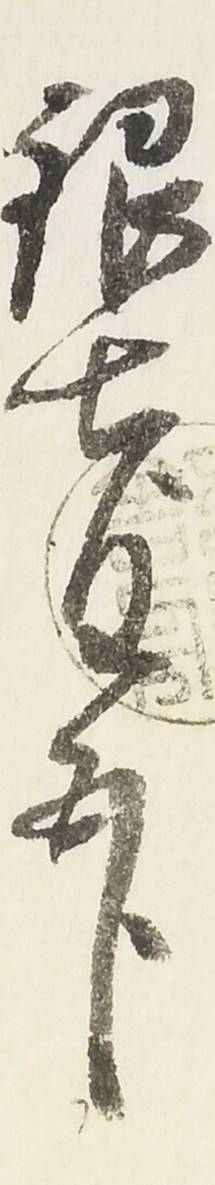銀七匁五分
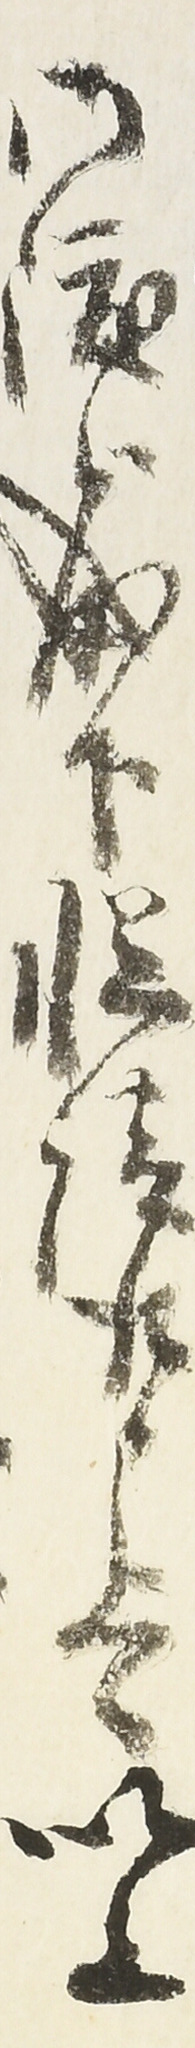御渡被成下慥請取申上候以上
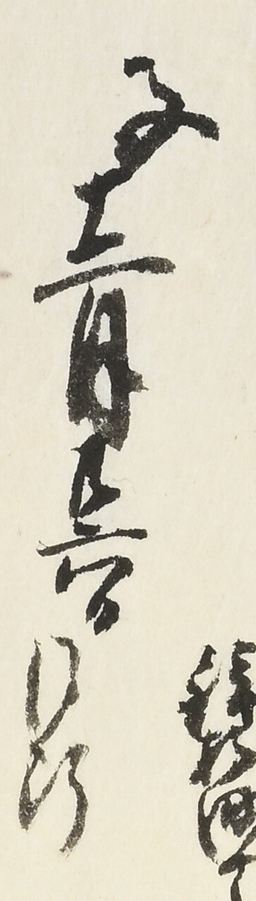十二月廿六日同断
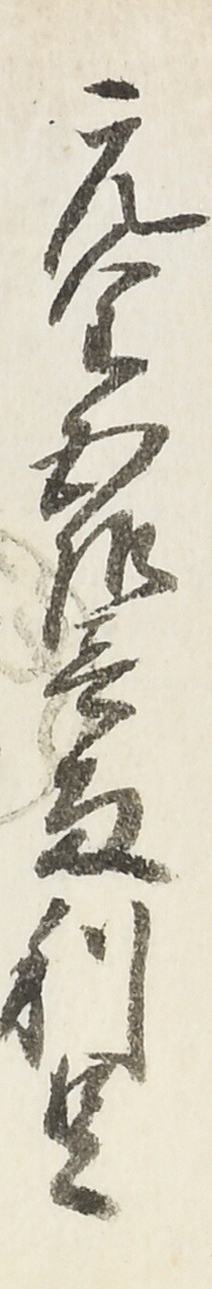元金五拾壱両利足
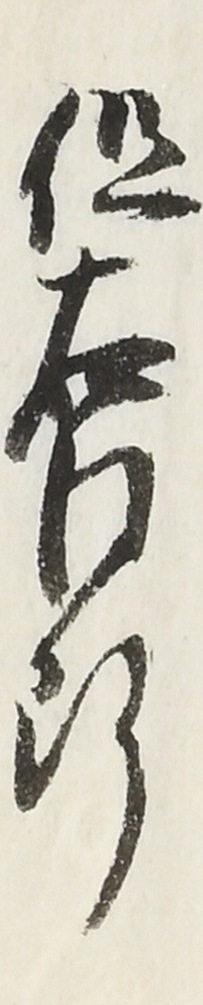但右同断
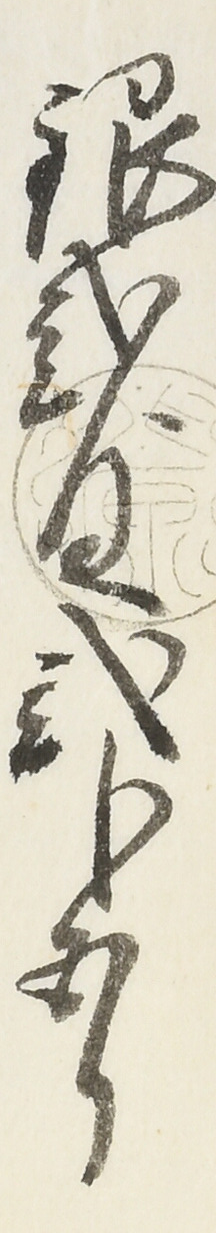銀弐匁弐分五厘
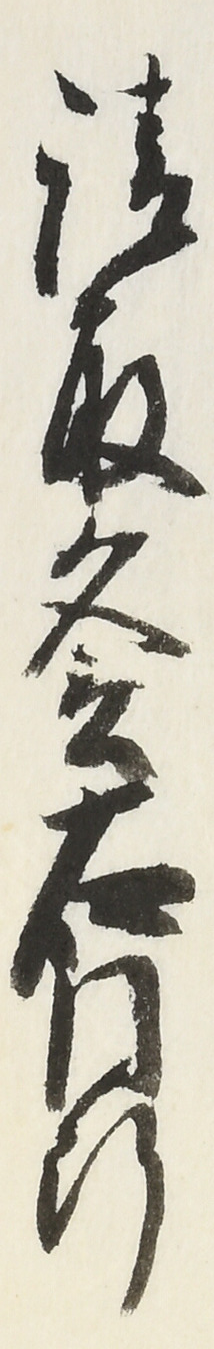請取文言右同断
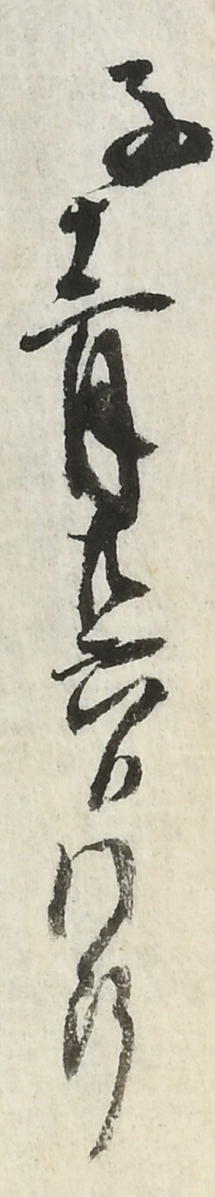十二月廿六日同断
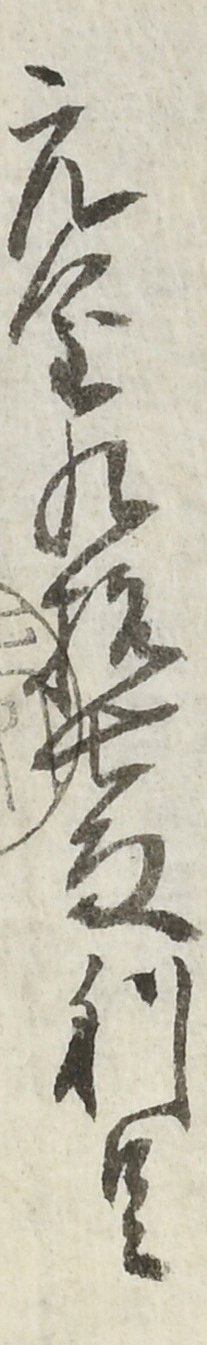元金九拾七両利足
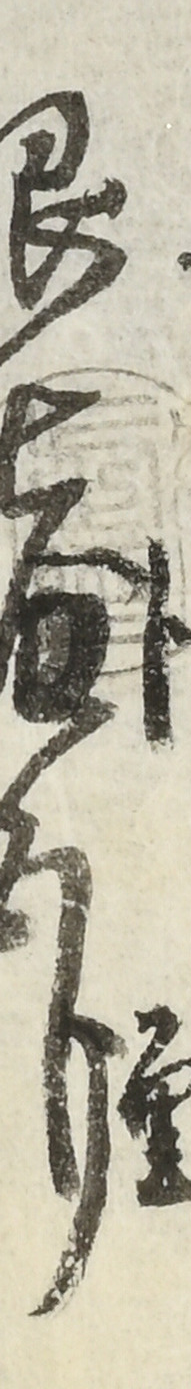銀七匁五分

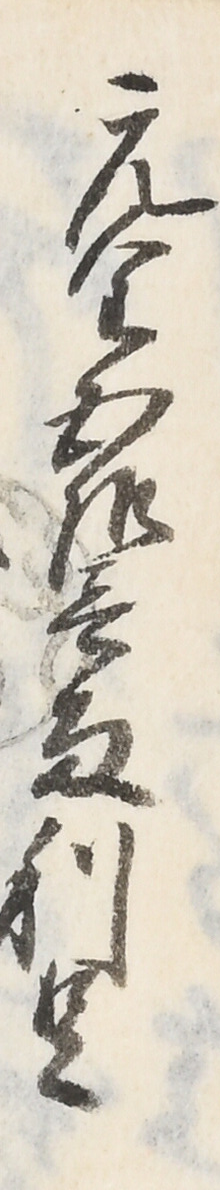元金五拾壱両利足
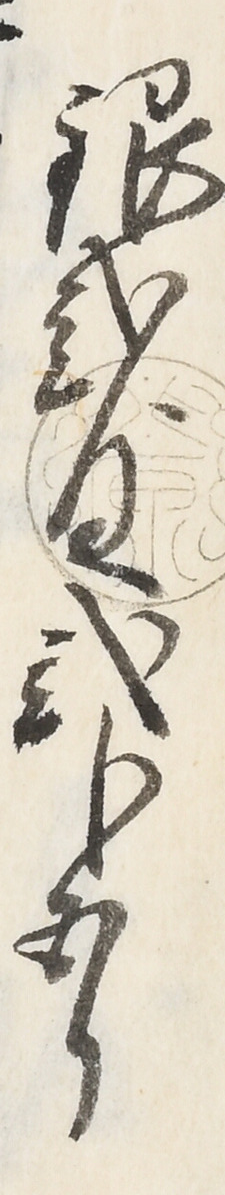銀弐匁弐分五厘
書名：御乗出シ御才覚金割合扣帳
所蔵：伊那市立高遠町図書館・合同会社AMANE
